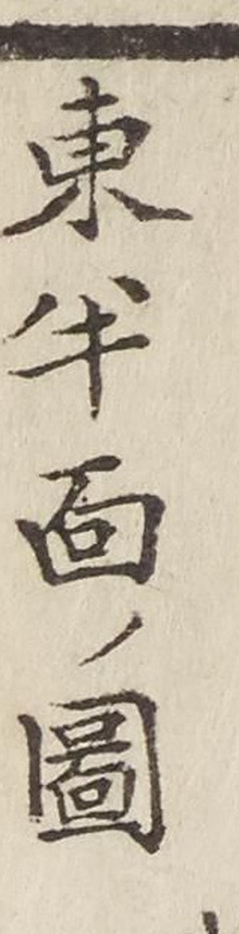西半面ノ図
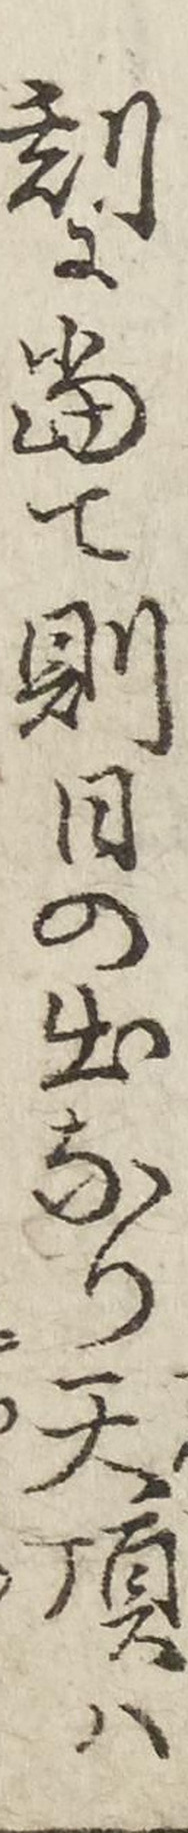刻に当て則日の出なり天頂は
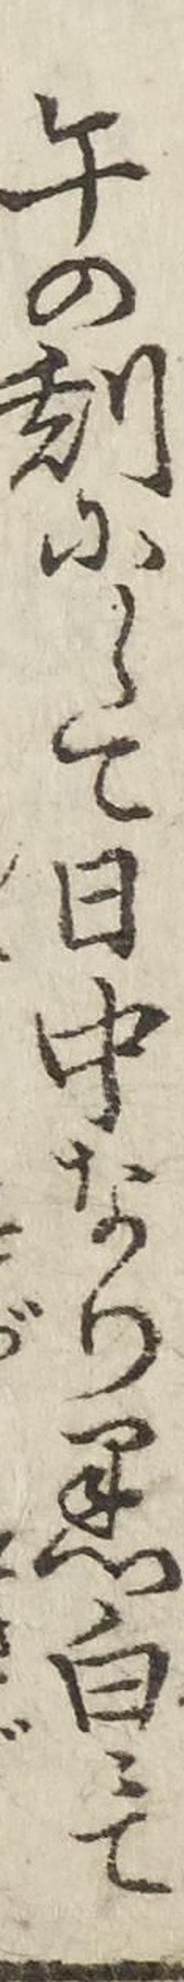午の刻にして日中なり黒白にて
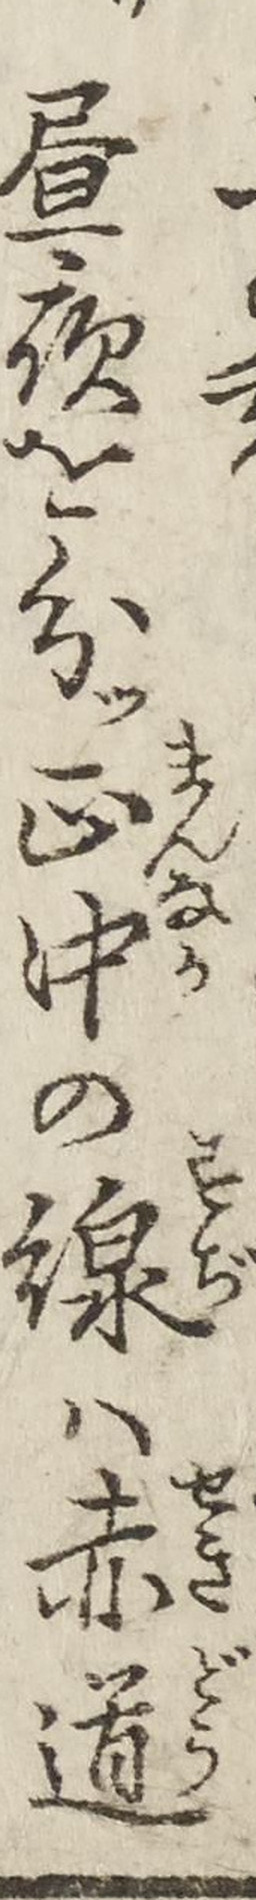昼夜を分つ正中の線は赤道
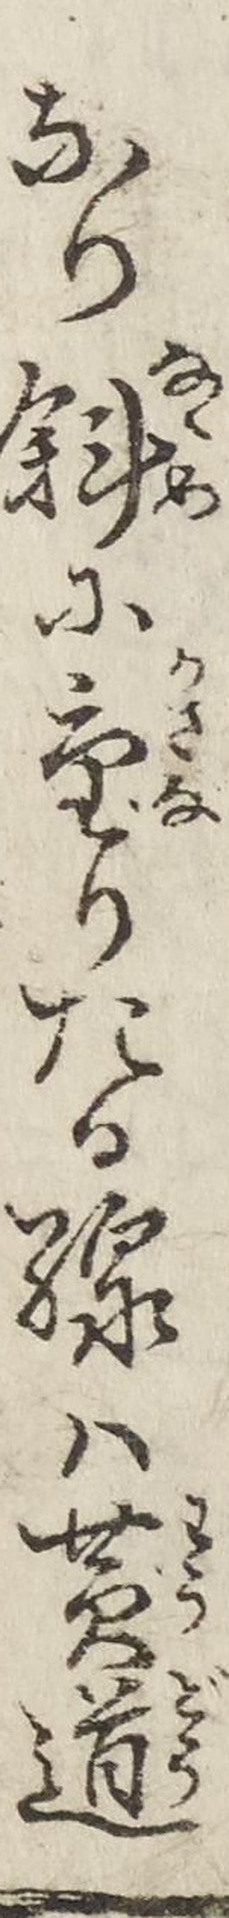なり斜に重りたる線は黄道
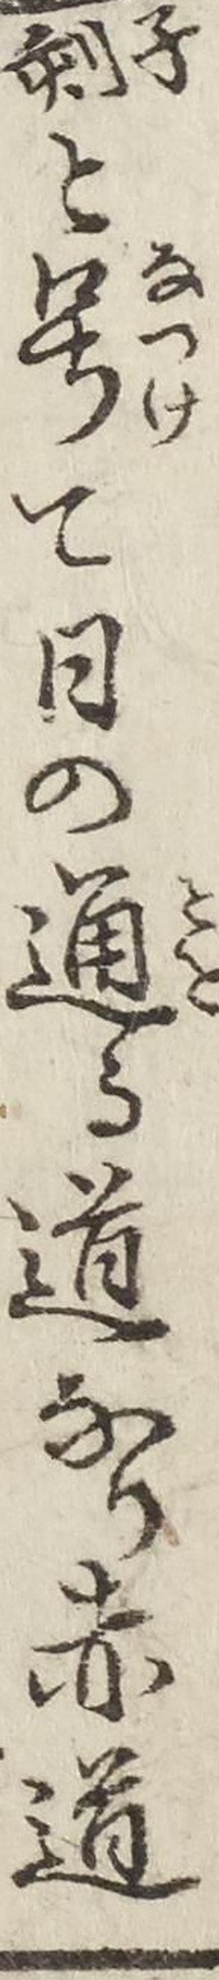と号て日の通る道なり赤道
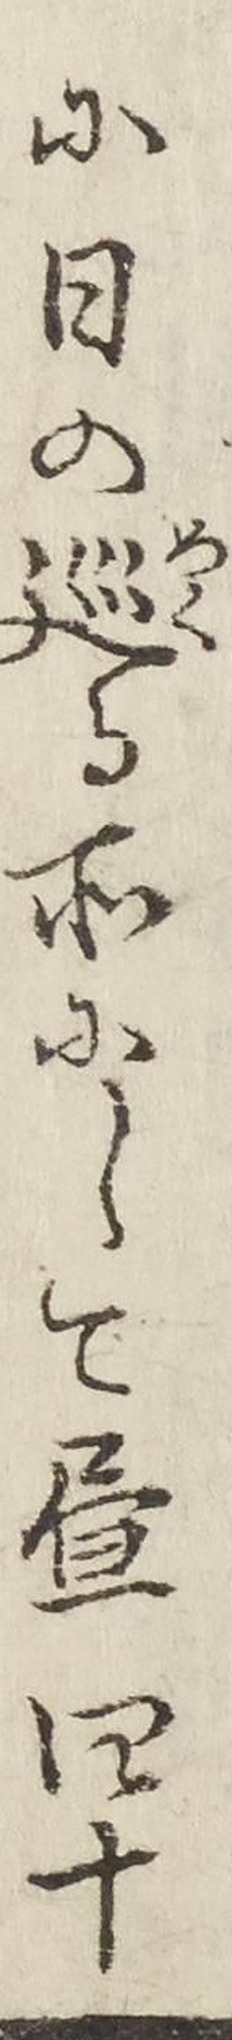に日の巡る所にして昼四十
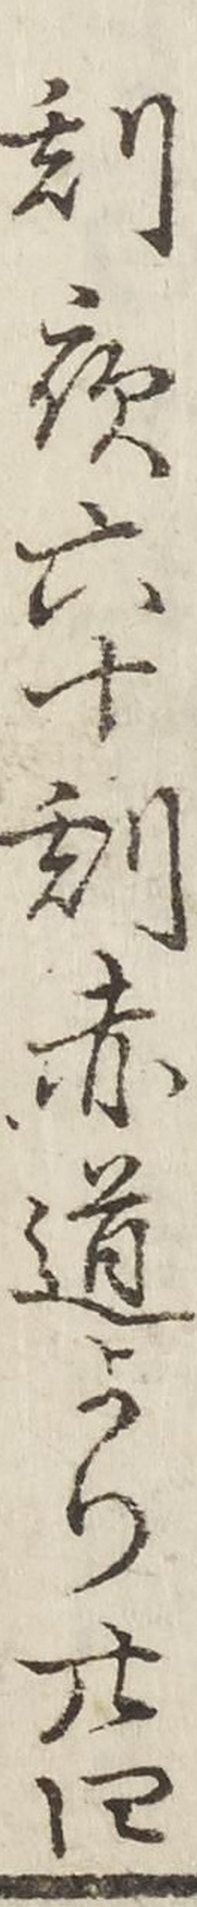刻夜六十刻赤道より廿四
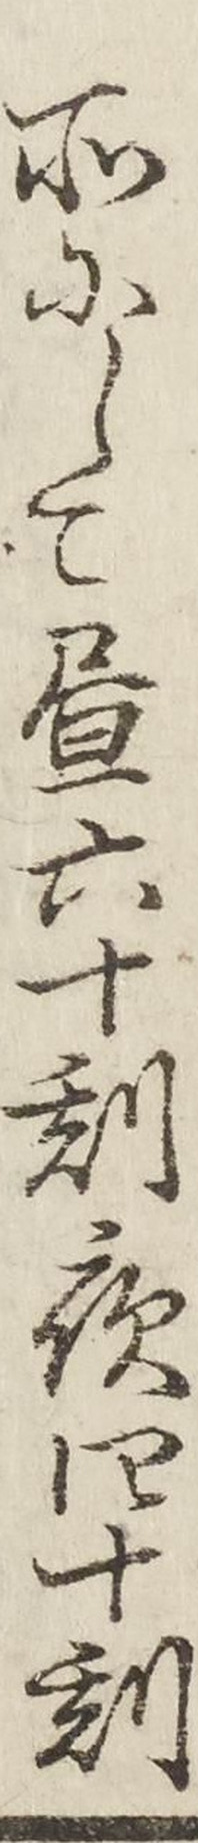所にして昼六十刻夜四十刻
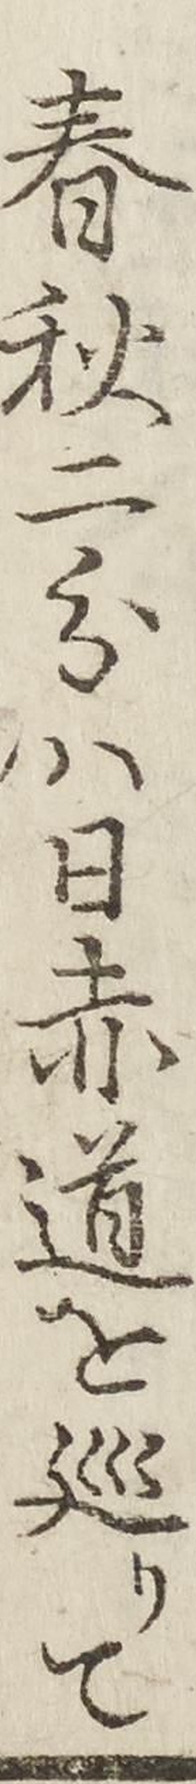春秋二分は赤道を巡りて
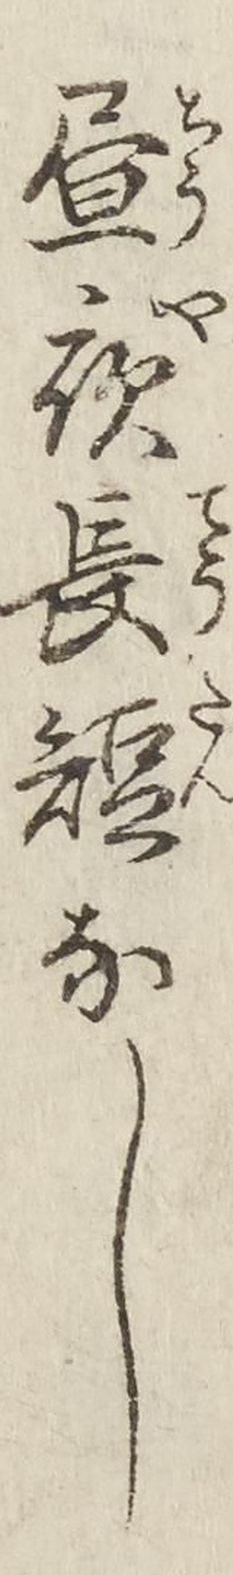昼夜長短なし
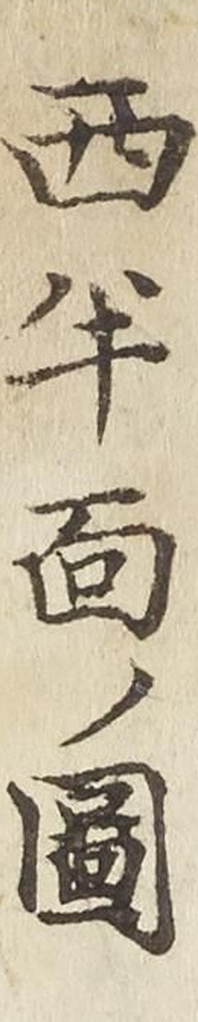西半面ノ図
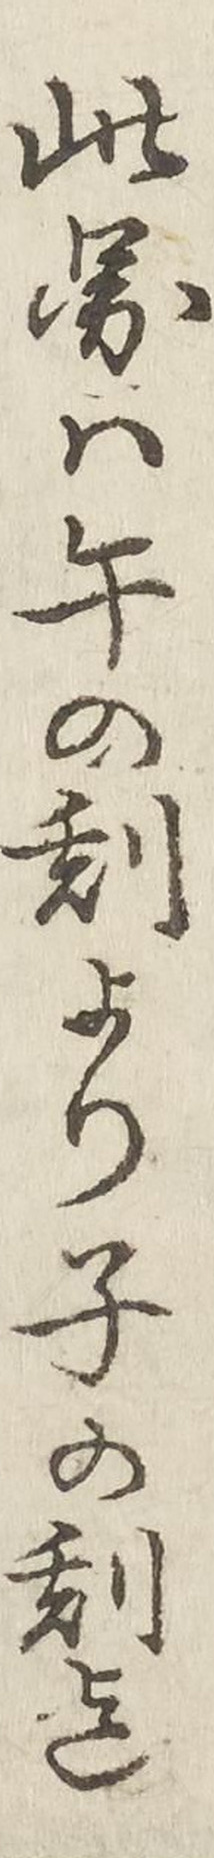此図は午の刻より子の刻迄
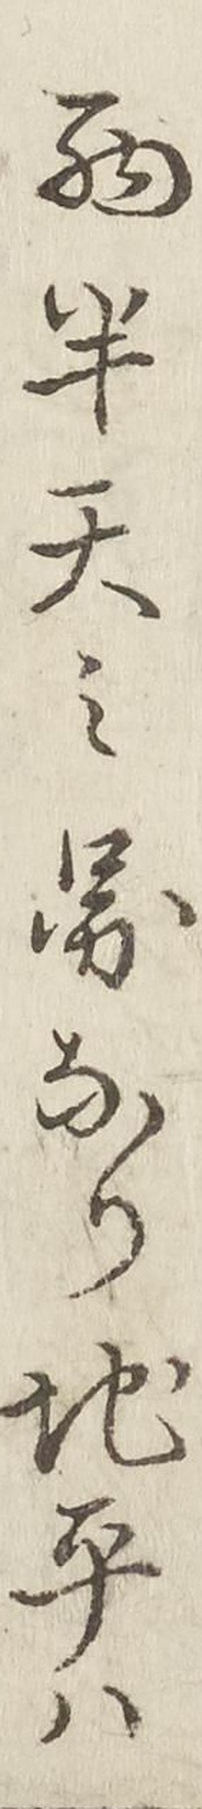西半天之図なり地平は
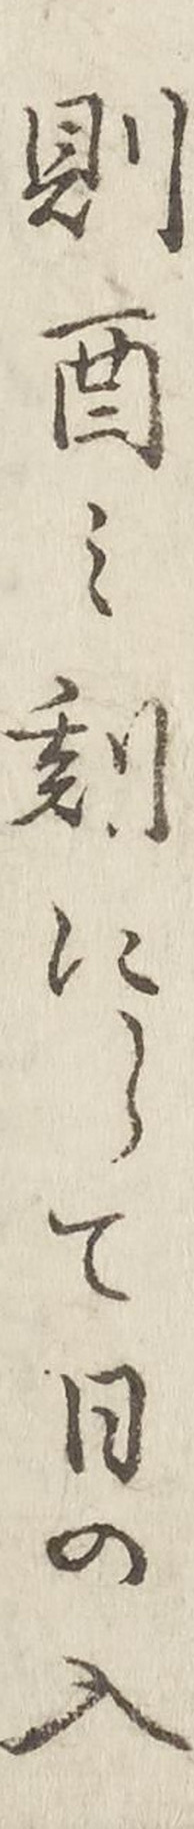即酉之刻にして日の入
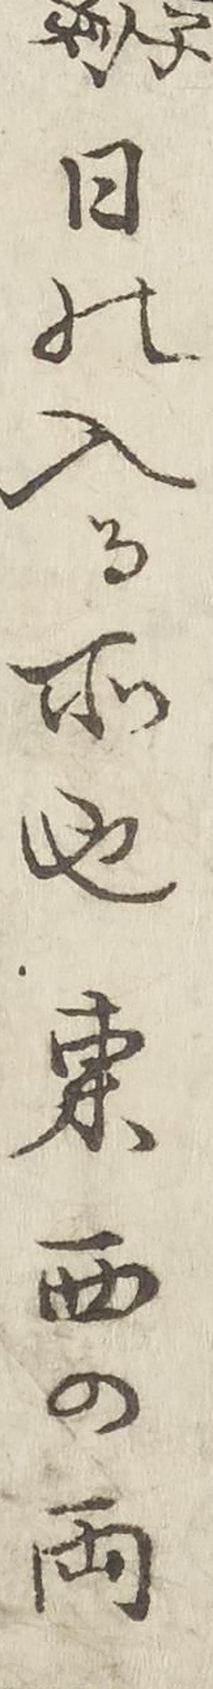日の入る所也東西の両
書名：平天儀圖解
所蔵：東京大学地震研究所図書室 Earthquake Research Institute Library, The University of Tokyo, JAPAN
